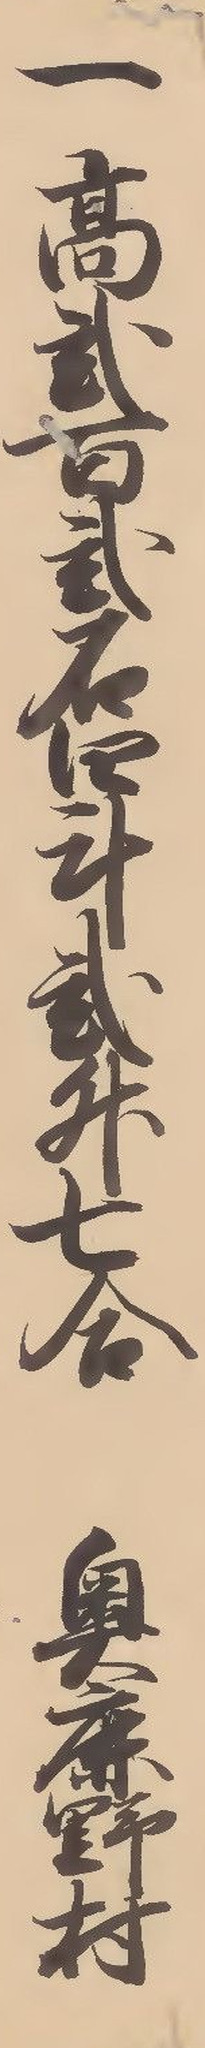一高弐百弐石四斗弐升七合奥鹿野村
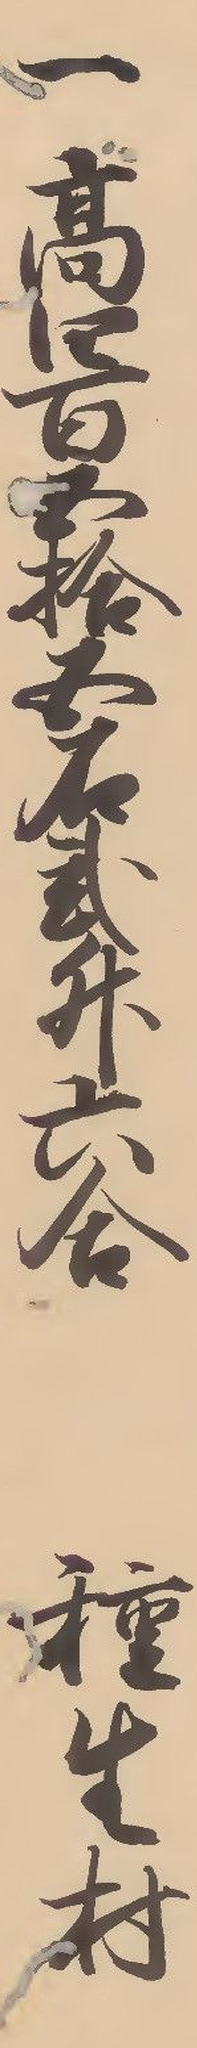一高四百五拾五石弐升六合種生村

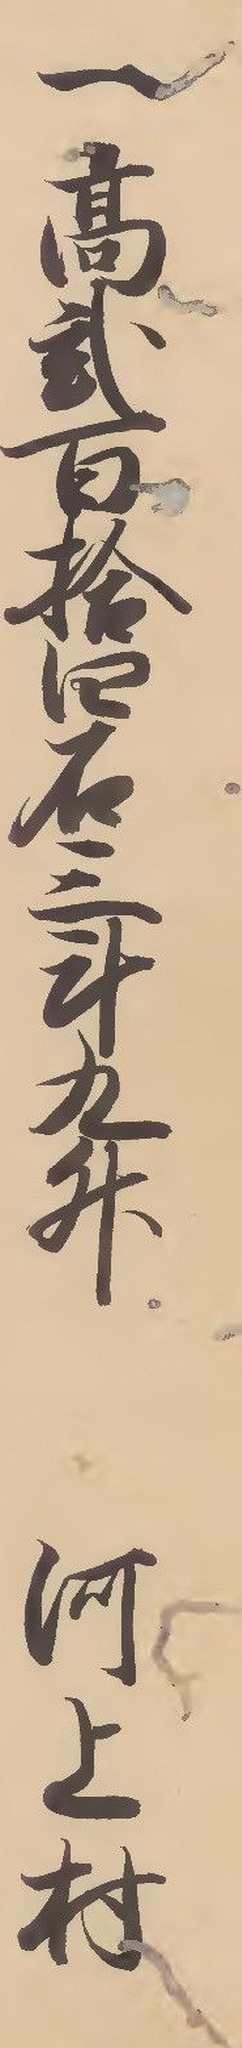一高弐百拾四石三斗九升河上村
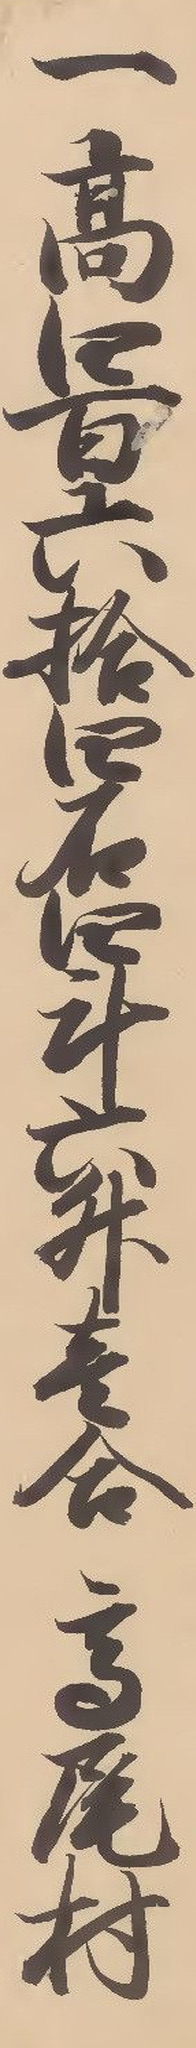一高四百六拾四石四斗六升壱合高尾村
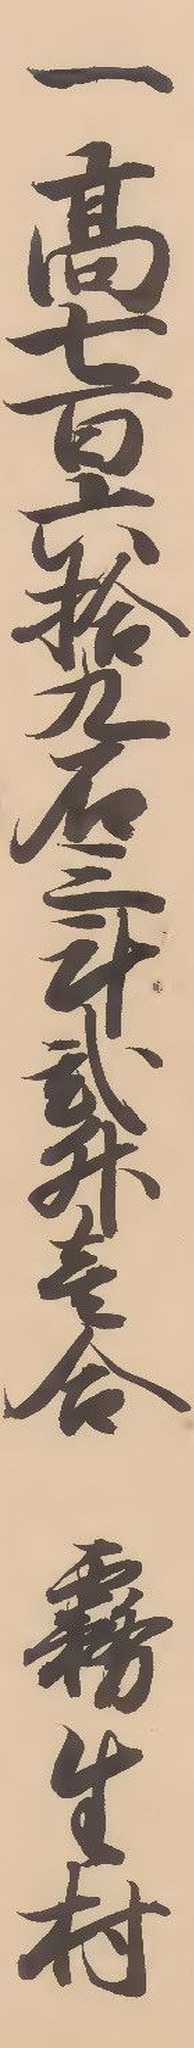一高七百六拾九石三斗弐升壱合霧生村
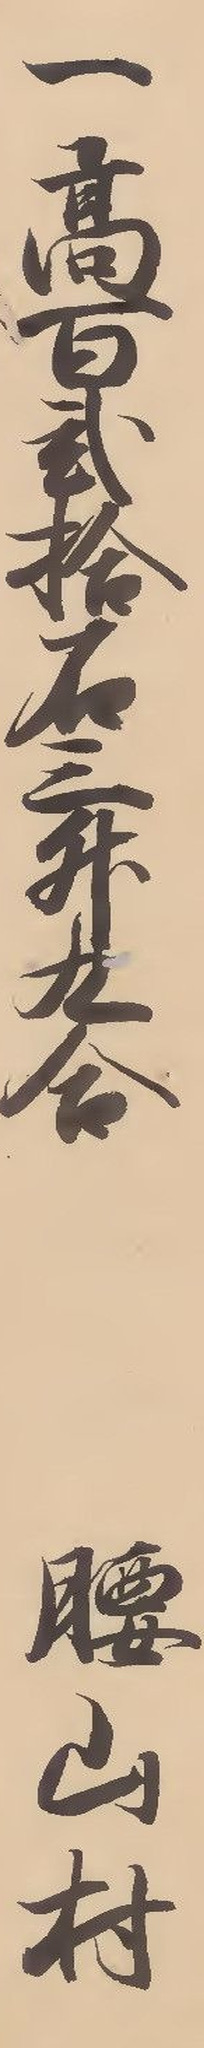一高百弐拾石三升九合腰山村
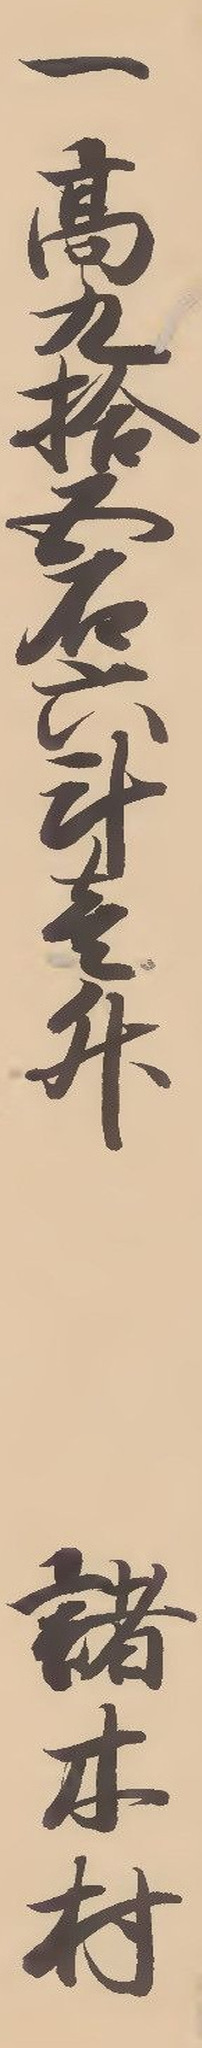一高九拾五石六斗壱升諸木村
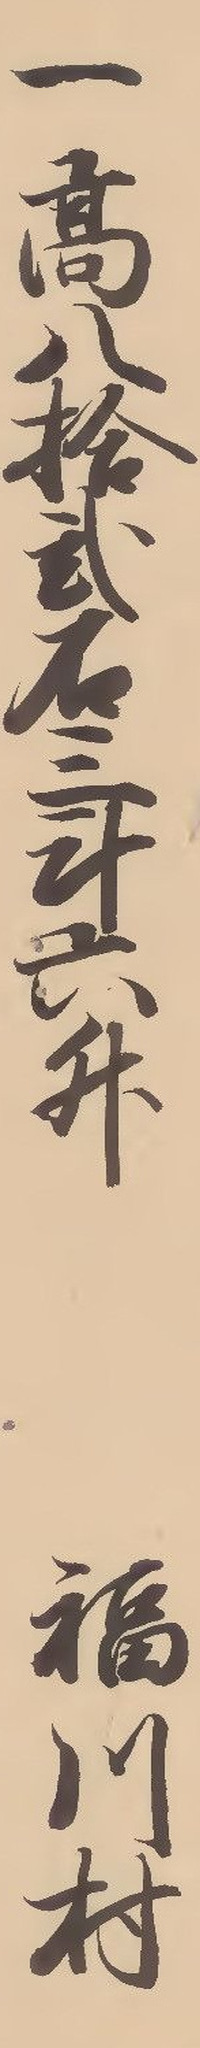一高八拾弐石三斗六升福川村
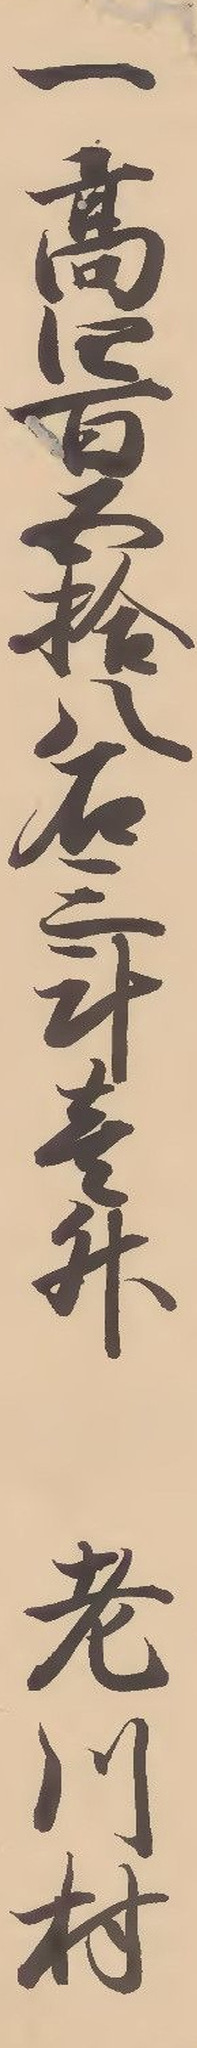一高四百五拾八石三斗壱升老川村
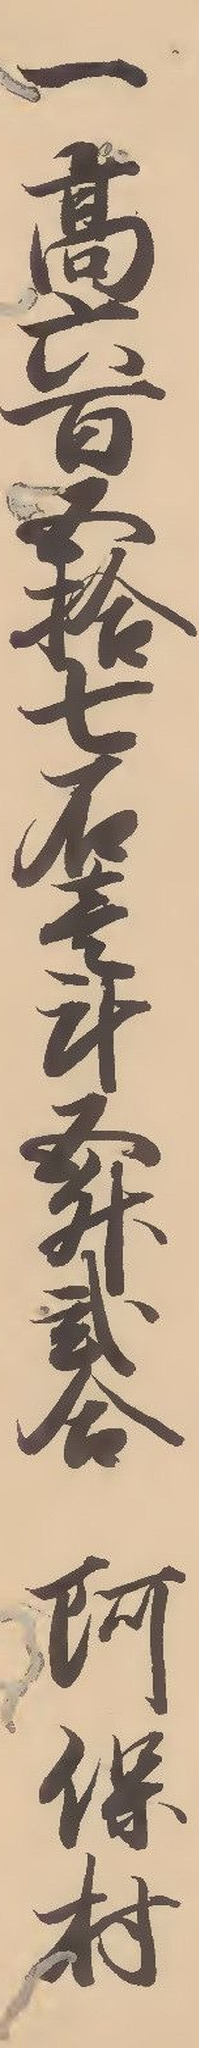一高六百五拾七石壱斗五升弐合阿保村

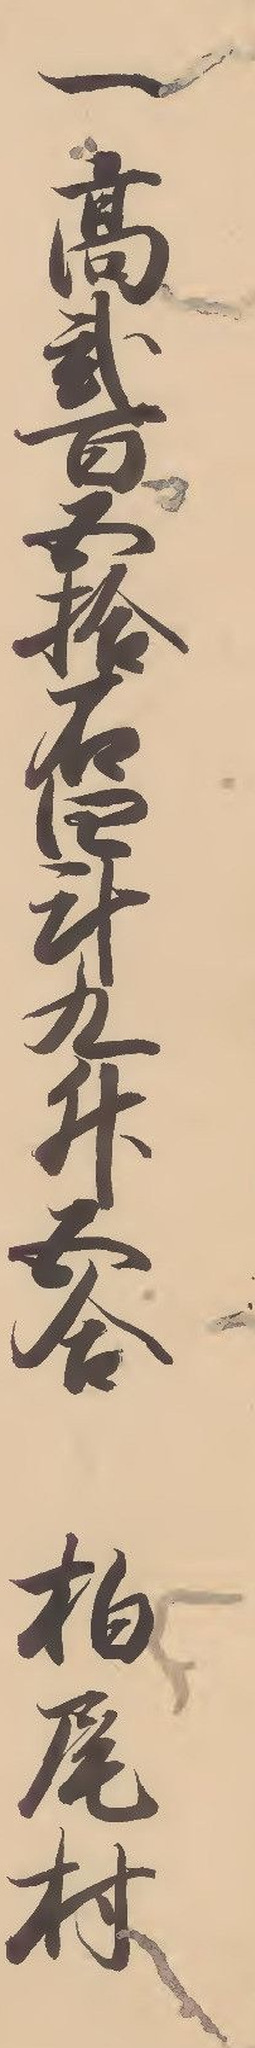一高弐百五拾石四斗九升五合柏尾村
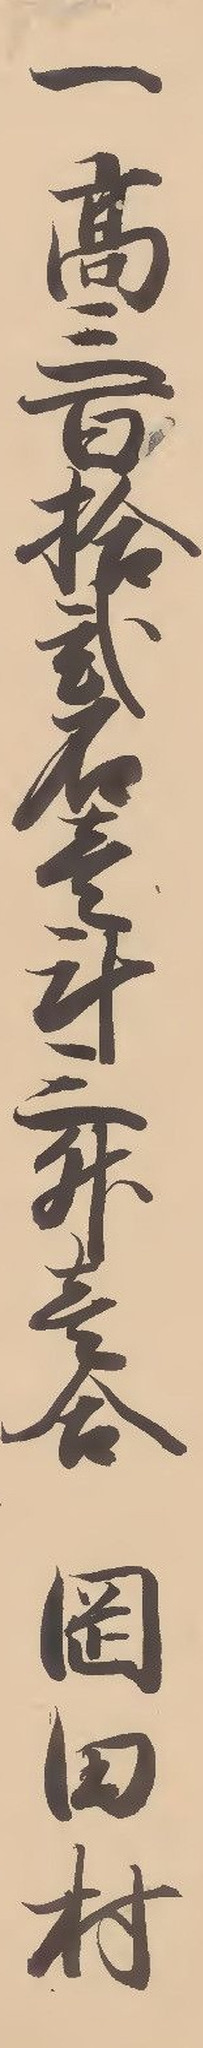一高三百拾弐石壱斗三升壱合岡田村
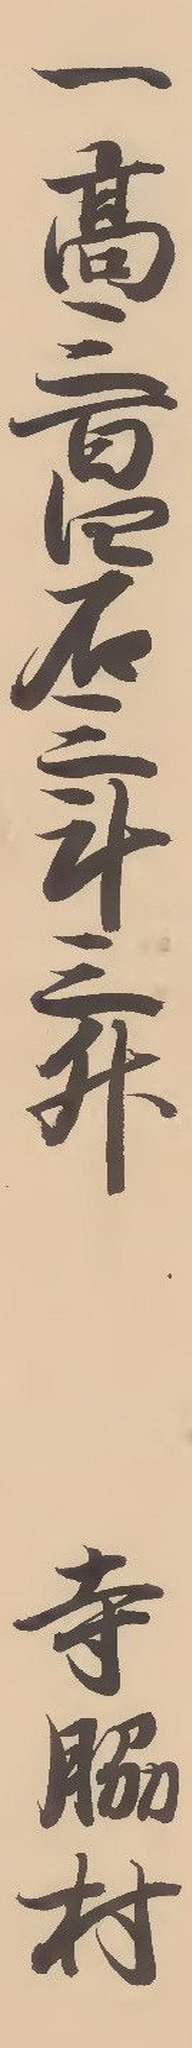一高三百四石三斗三升寺脇村
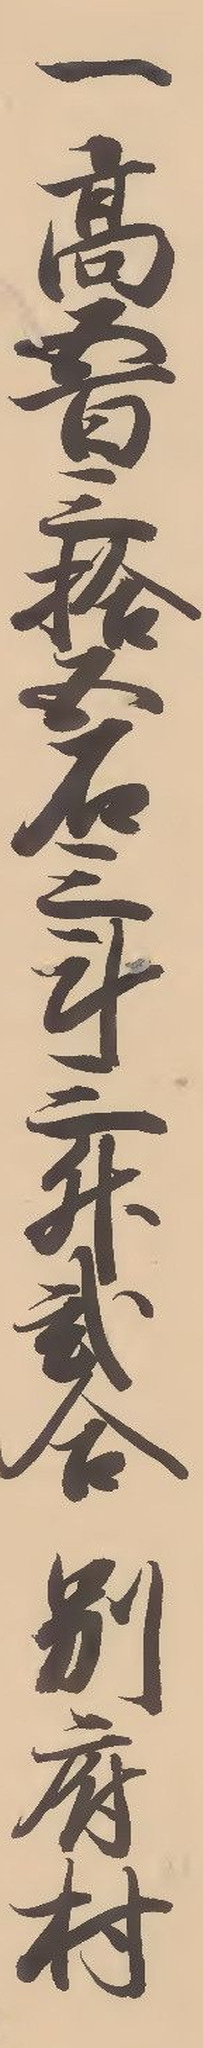一高五百三拾五石三斗三升弐合別府村
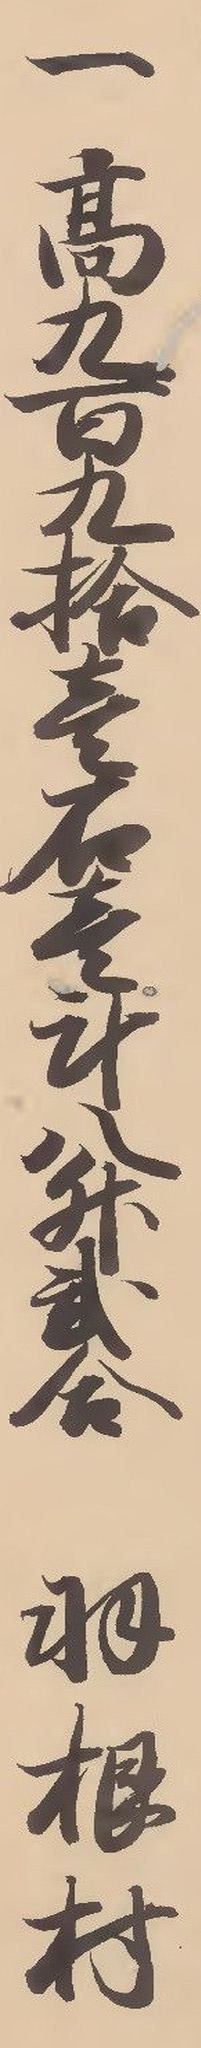一高九百九拾壱石壱斗八升弐合羽根村
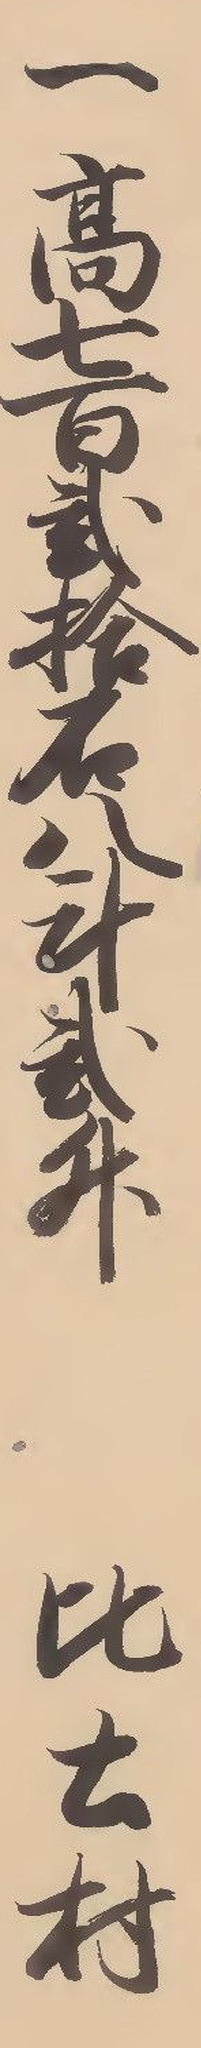一高七百弐拾石八斗弐升比土村
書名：伊賀国郷帳
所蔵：国立公文書館 National Archives of Japan
